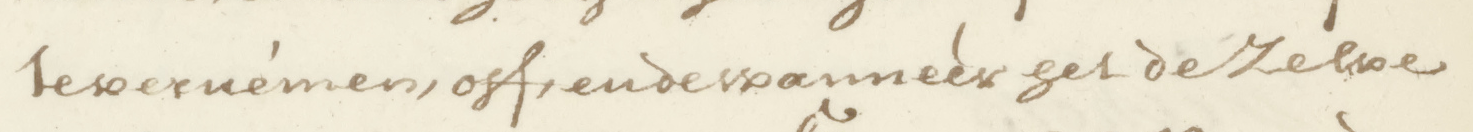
te vernemen, off ende wanneer het de zelve
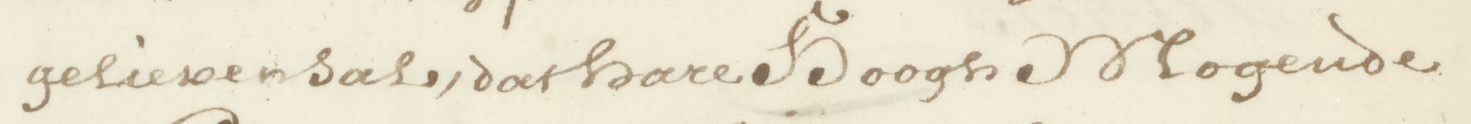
gelieven sal, dat hare Hoogh Mogende
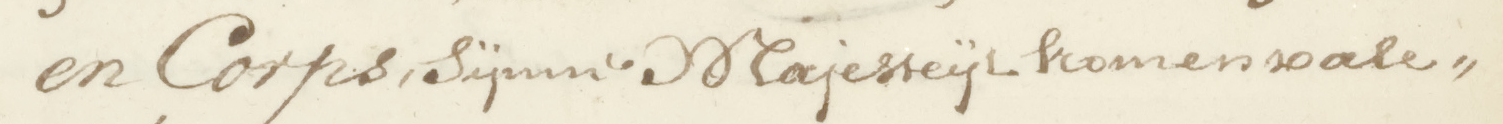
en corps Sijne Majesteijt komen vale„
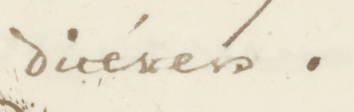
diceren.
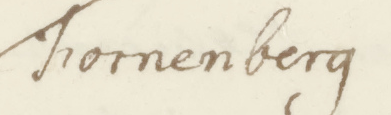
Fornenberg
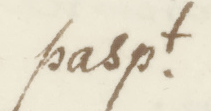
paspt
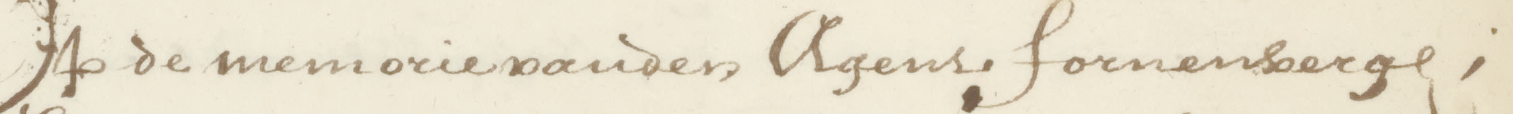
Op de memorie vanden Agent Fornenbergh
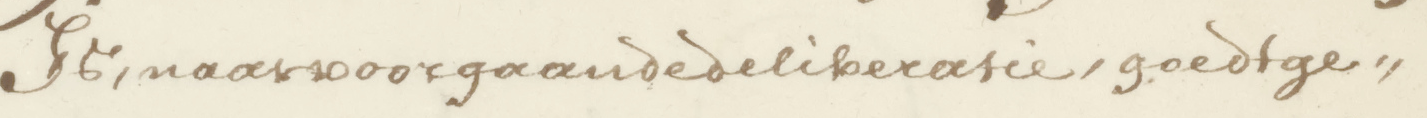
Is naar voorgaande deliberatie, goedtge„
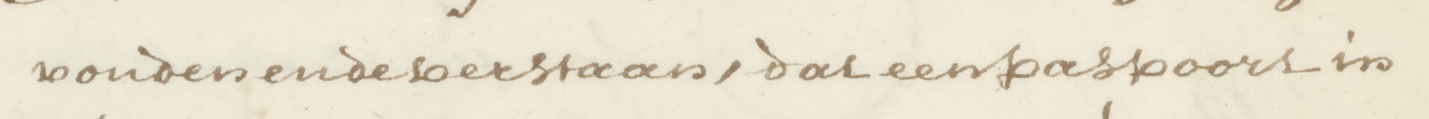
vonden ende verstaan, dat een paspoort in
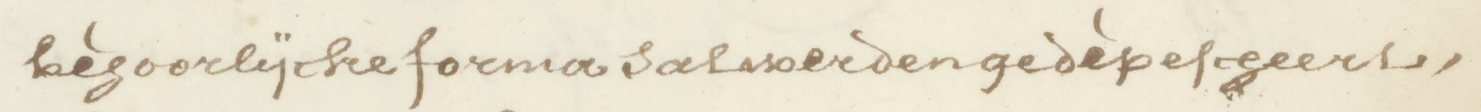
behoorlijcke forma sal werden gedepescheert
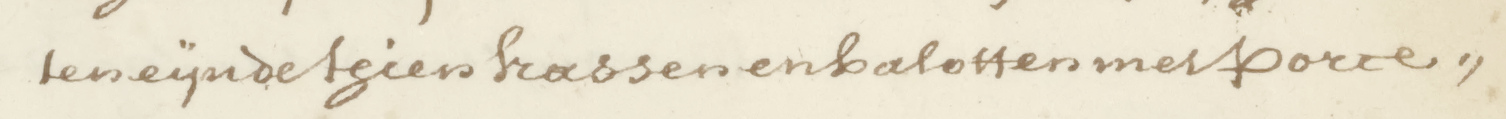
teneijnde thien kassen en balotten met porce„
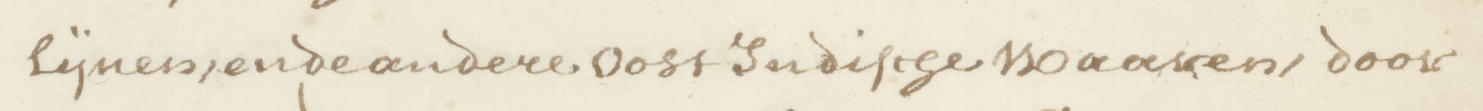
lijnen ende andere oost indische waaren, door
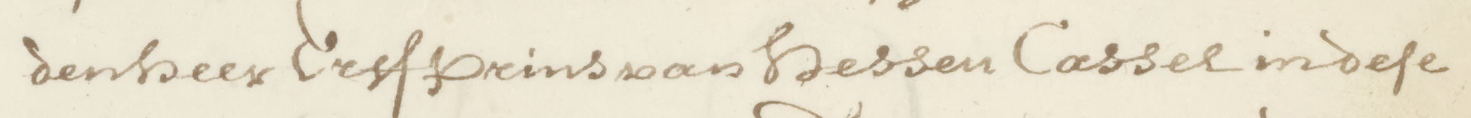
den heer Erffprins van Hessen Cassel in dese
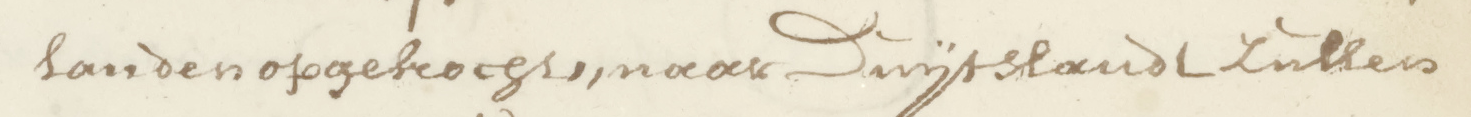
landen opgekocht, naar Duijtslandt zullen
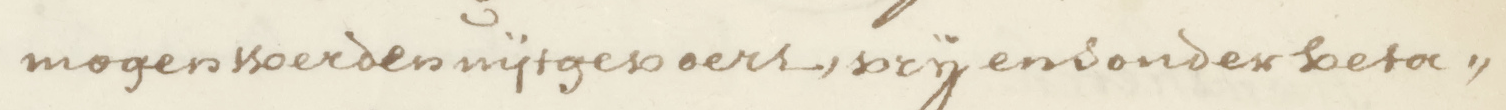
mogen werden uijtgevoert, vrij en sonder beta„
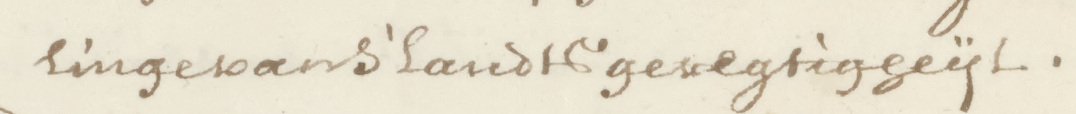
linge van s'landts geregtigheijt.
